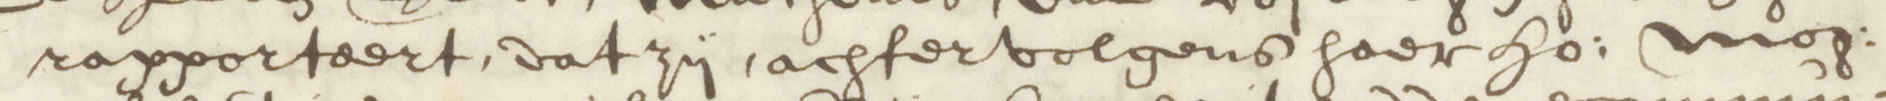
rapporteert, dat zij, achtervolgens haer Ho:Mo:
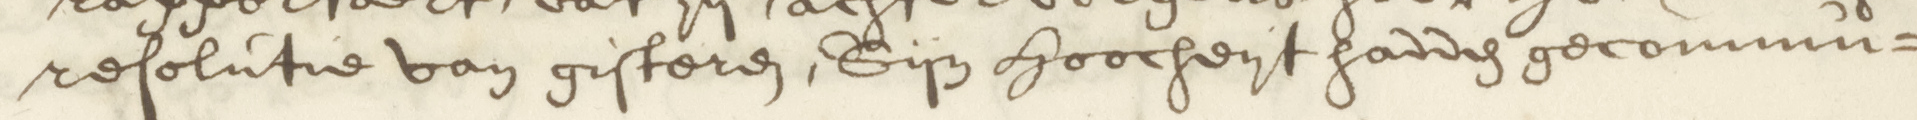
resolutie van gisteren, Sijn Hoocheijt hadden gecommun„
